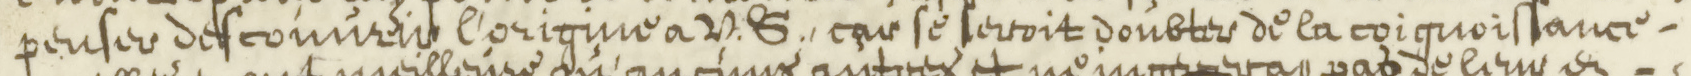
penser descouurir l‛origine a V.S. car se seroit doubter de la coignoissance
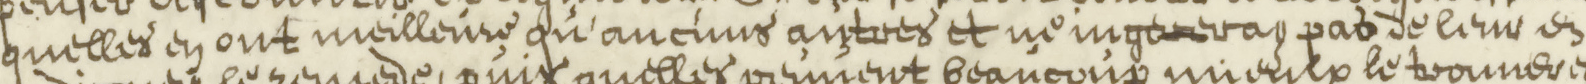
quelles en ont meilleure qu‛aucuns autres et ne ingeray pas de leur en
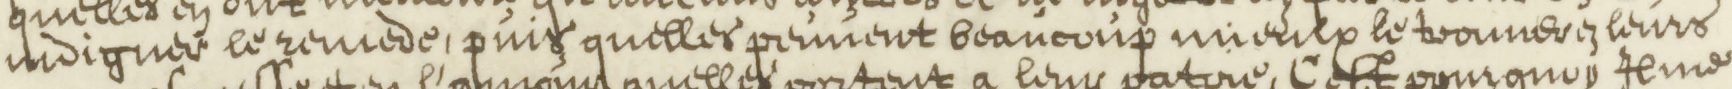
indigner le remede, puis quelles peuuent beaucoup mieulx le trouuer ez leurs
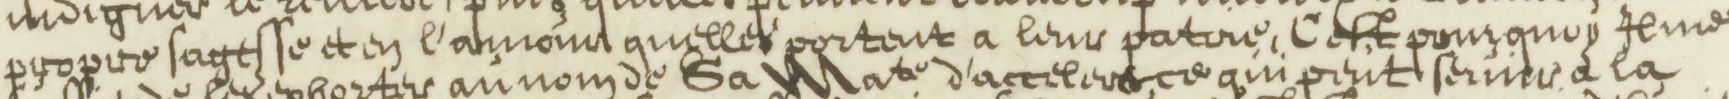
propre sagesse et en l‛amour quelles portent a leur patrie, Cest pourquoy Il me
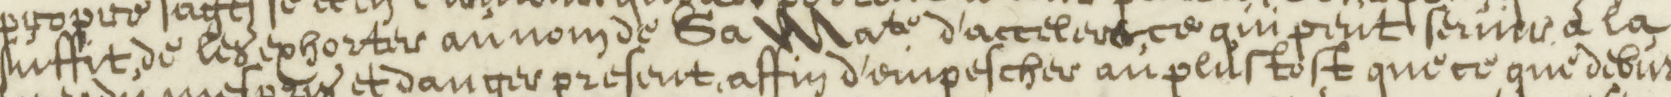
suffit de les exhorter au nom de Sa Mate. d'accelerer ce qui peut seruir à la
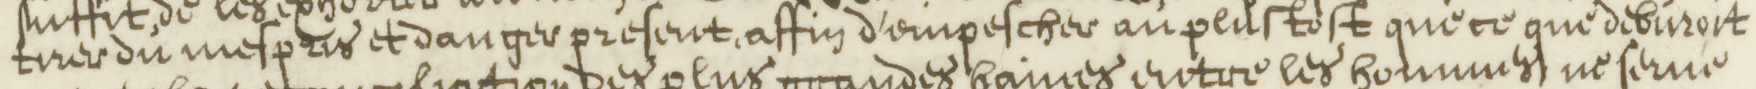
tirer du mespris et danger present affin d'empescher au plustost que ce qui deburoit
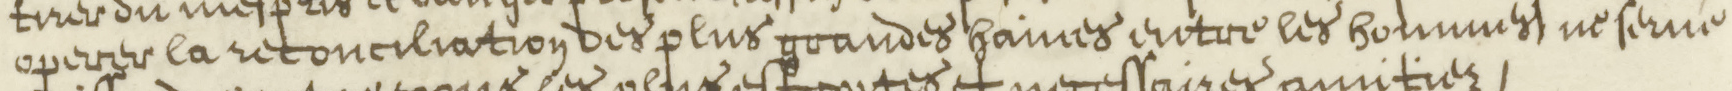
operer la reconciliation des plus grandes haines entre les hommes ne serue
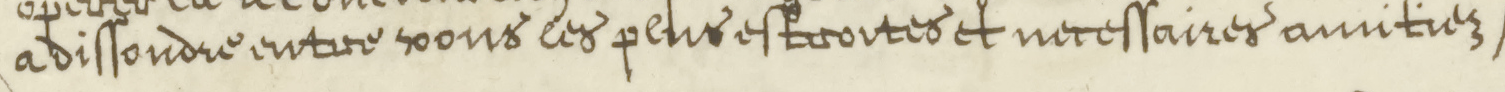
a dissondre entre vous les plus estroites et necessaires amitiez
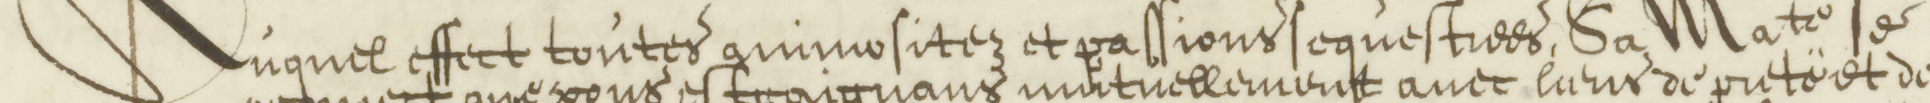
Auquel effect toutes animositez et passions sequestrees, Sa Mate se
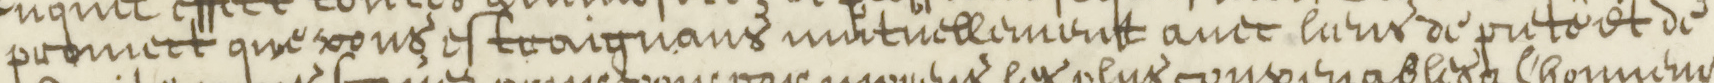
promect que vous estraignans mutuellement aux lieus de pieté et de
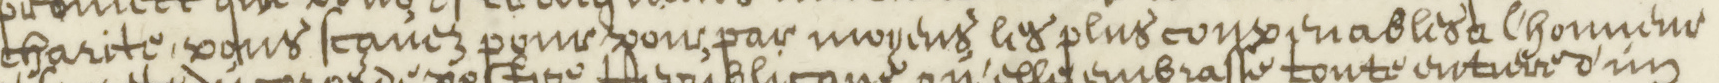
charite vous scauez pour voir par moyens les plus convenables a l‛honneur
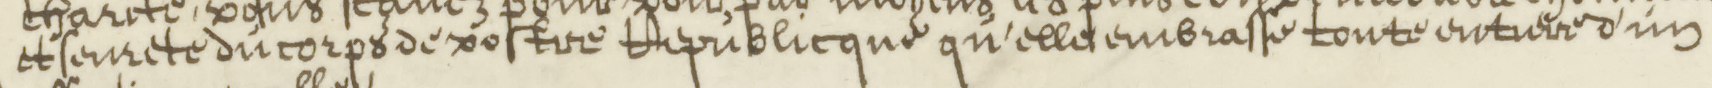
et seurete du corps de vostre Republicque qu‛elle embrasse toute entier d‛une
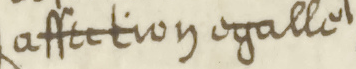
affection egalle.
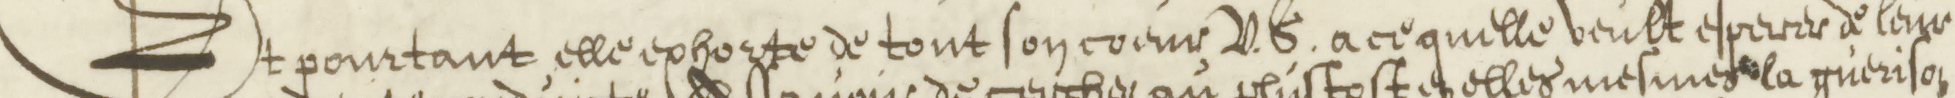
Et pourtant elle exhorte de tout son coeur V.S. a ce quelle veult esperer de leur
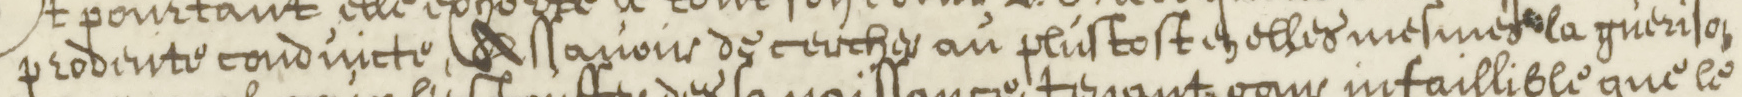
prodente conduicte, Assauoir de cerchey au plustost en elles mesmes la guerison
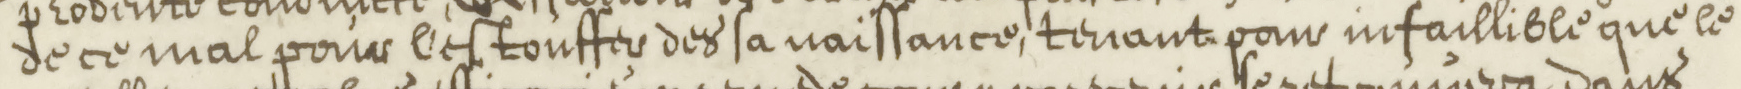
de ce mal pour l‛estouffer des sa naissance, tenant pour infaillible que le
